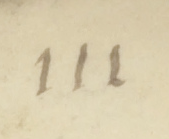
111
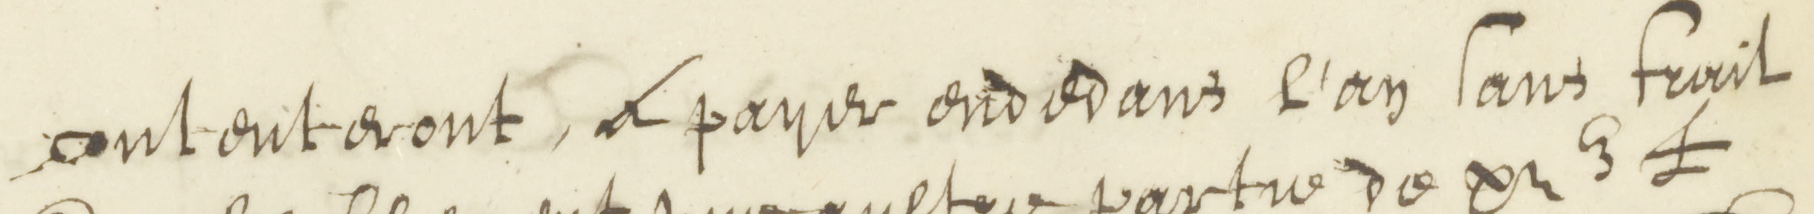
contenteront, a payer en dedans l‛an sans trail
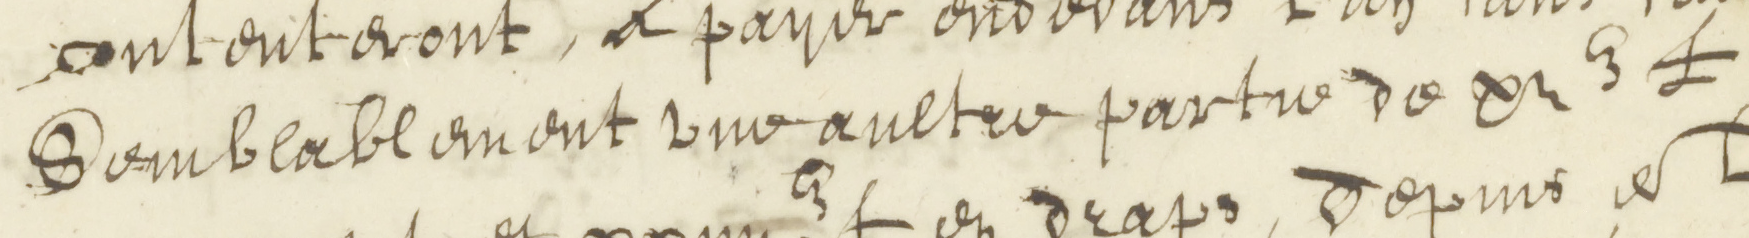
Semblablement vue aultre partie de xiim. L.
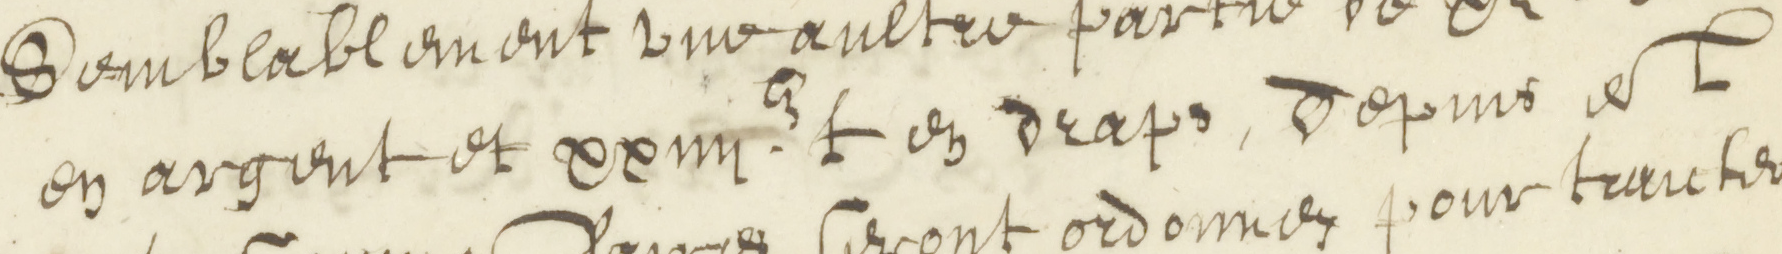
en argent et xxiijm. L en draps, depuis est
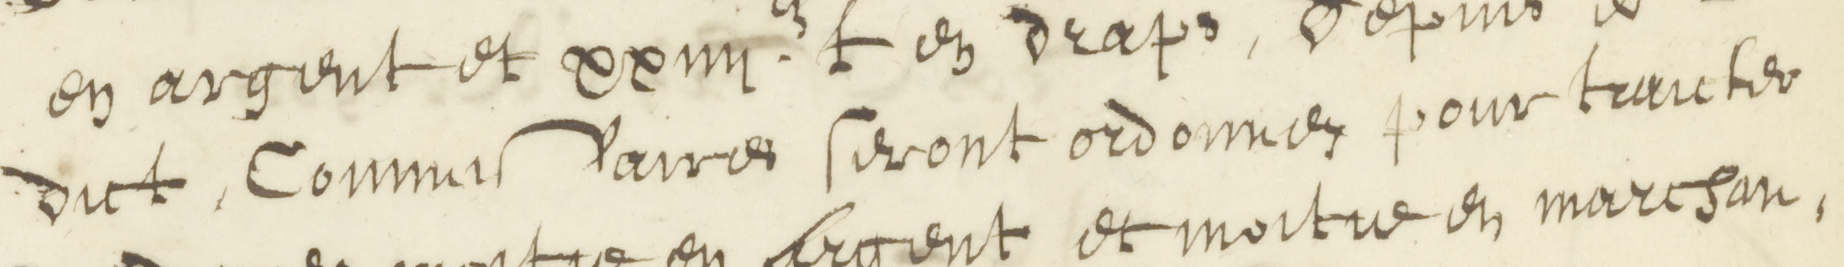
dict, Commissaires seront ordonnez pour traicter
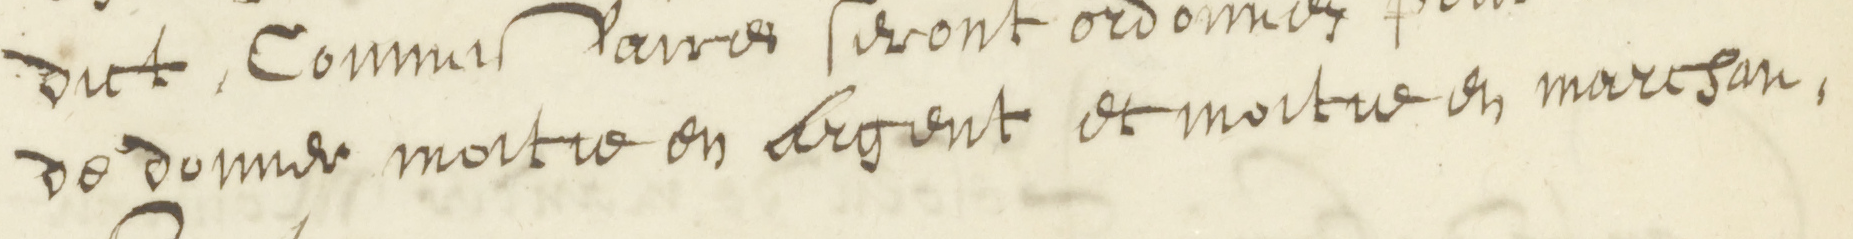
de donner moitie en argent et moitie en marchan,
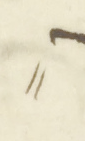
„dise.
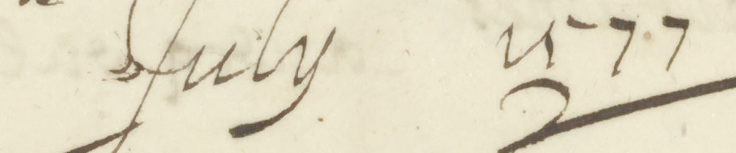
XIIa July 1577
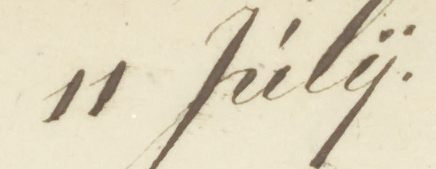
11 Julij.
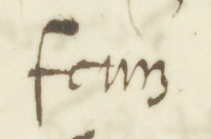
fcmn
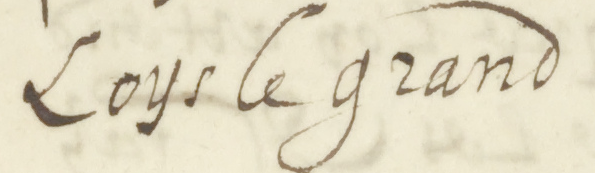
Loys le grand
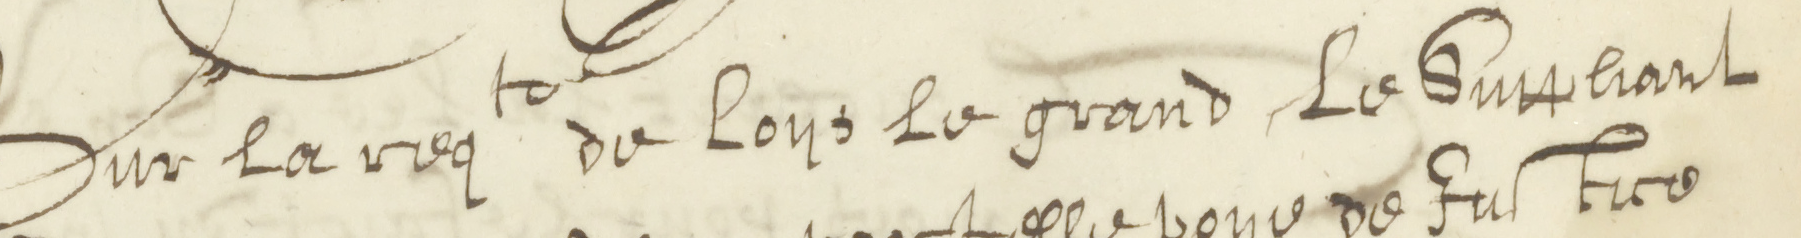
Sur la reqte de Loys le grand Le Suppliant
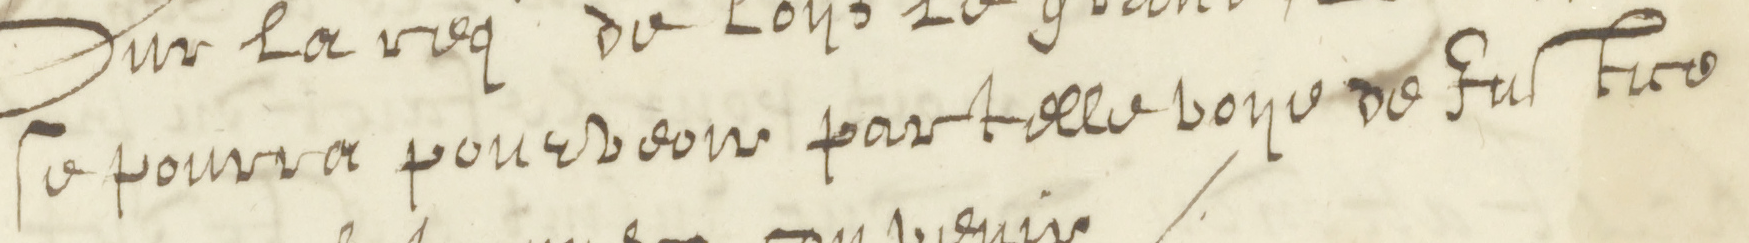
se pourra pourveoir par telle voye de Justice
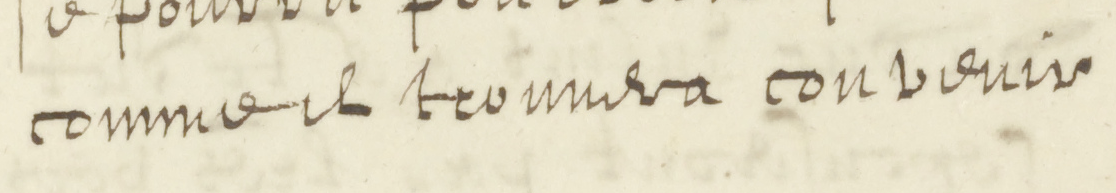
comme il trouuera convenir
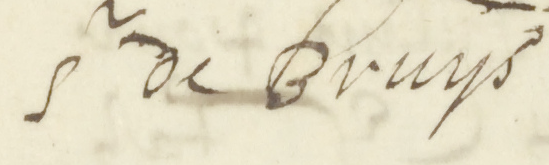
sr de Bruys
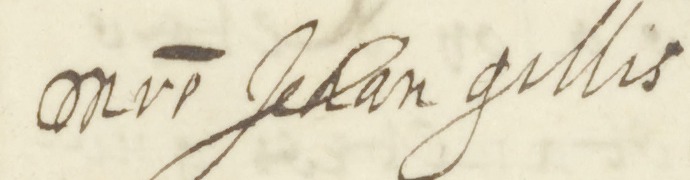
mre. Jehan gillis
